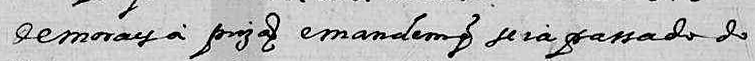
de morais à prizaꝭ e mandem q̄ seia passado do
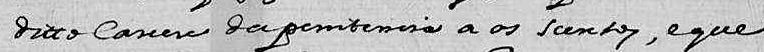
ditto carcere da penitencia aos santos, e que
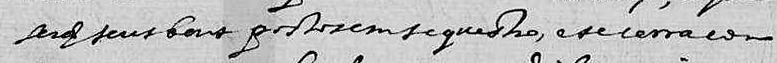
serão seus bens postos em sequestro, e se cerra com
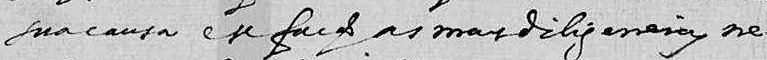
sua causa e se façaꝭ as mais diligencias ne
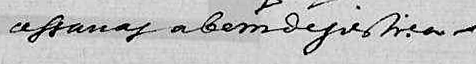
cessarias a bem de justiça
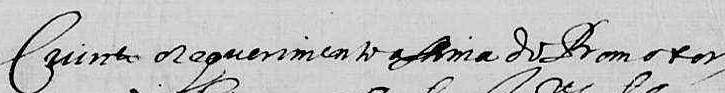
E iunto o requerimento assima do Promotor,
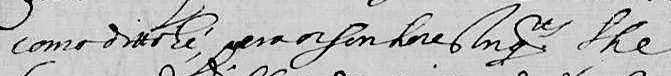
como ditto hé, pera os senhores Inq.res lhe
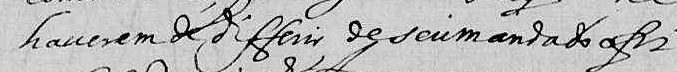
hauerem de differir de seu mandado o fiz
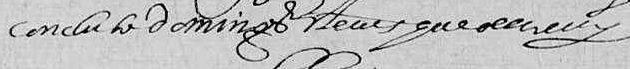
concluso domingos Esteues que o escreuy
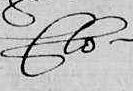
Clo
